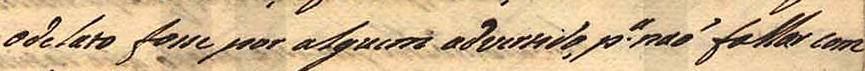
o delato fosse por alguem advertido p.a naõ fallar com
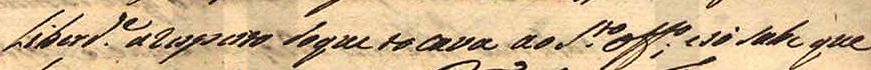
Liberd.e a respeito do que tocava ao s.to off.o; e só sabe que
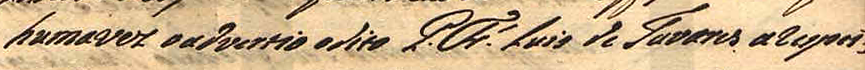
huma vez o advertio o dito P. Fr. Luis de Tavares a respei
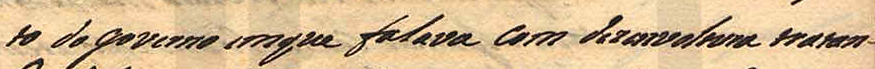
to do governo em que falava com dezenvoltura tratan
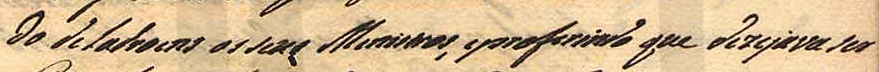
do de ladroens os seus Ministros, e proferindo que dezejava ser
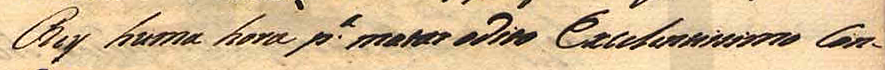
Rey huma hora p.a matar o dito Excelentissimo Con
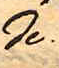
de.
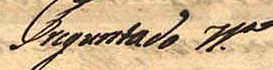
Preguntado tt.a
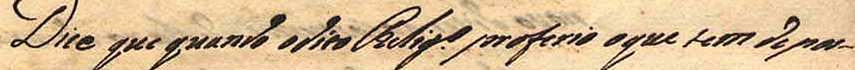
Dice que quando o dito Relig.o proferio o que tem depos
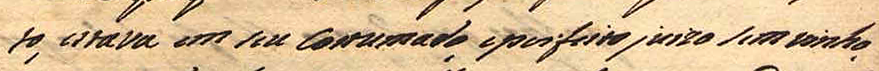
to, estava em seu costumado, e perfeito juizo sem vinho,
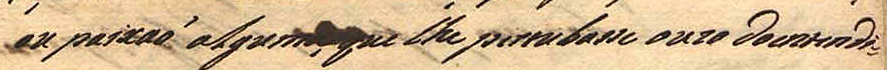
ou paixaõ alguma, que lhe pertubasse o uzo do entendi
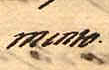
mento.
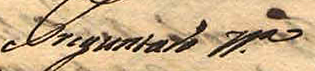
Preguntado tt.a
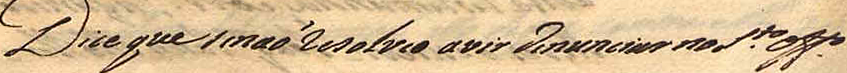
Dice que se não resolveo a vir denunciar no s.to Off.o
